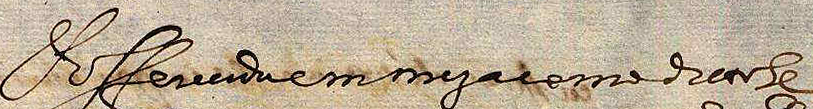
& offerecida em meza como dicto he
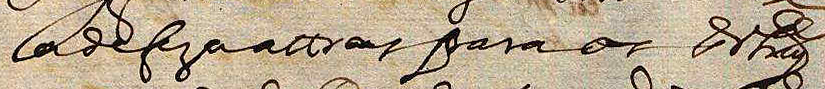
a defeza attras para os s̄res Inq̄res
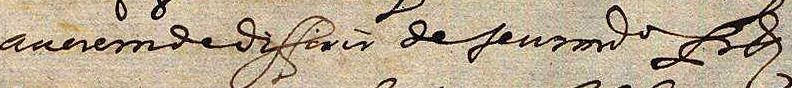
auerem de differir de seu mdo fiz
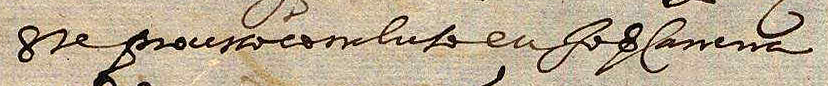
este processo concluso eu Joaõ Carreira
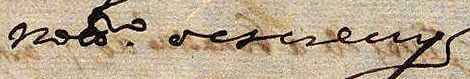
notro. o escreuy
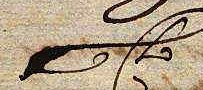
Clo
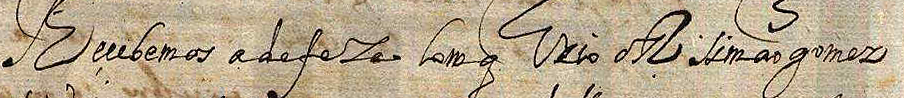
Reçebemos a defeza Com q̄ Veio o R Simaõ gomez
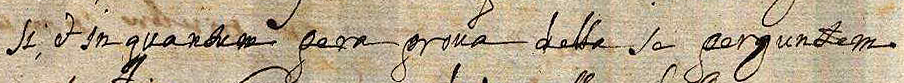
si, et in quantum pera proua della se perguntem
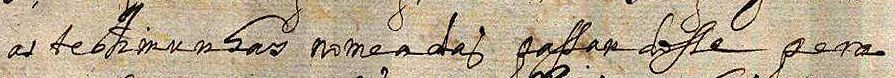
as testimunhas nomeadas passandosse pera
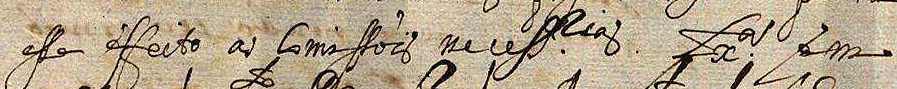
esse effeito as comissoĩs necess.rias Lxa. em
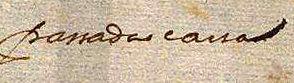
passada carta
